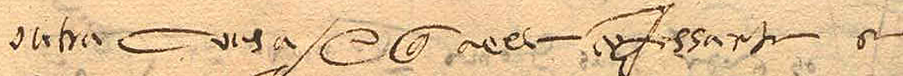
outra Cousa / e q̄ a elle cōfessante se
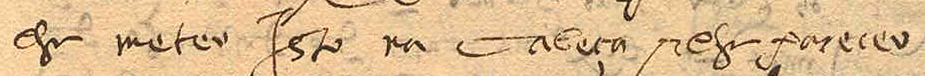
lhe meteo Jsto na cabeça e lhe pareceo
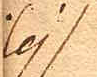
lej /
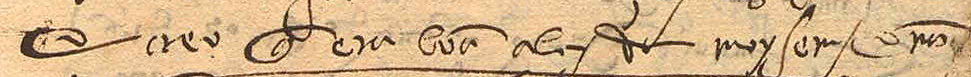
e creo q̄ era bōa a ley de moysem / e nā
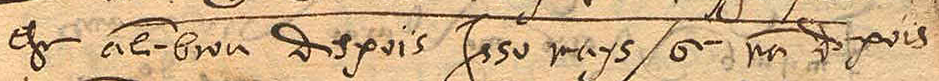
lhe alēbrou despois Jsso mays / se nā despois
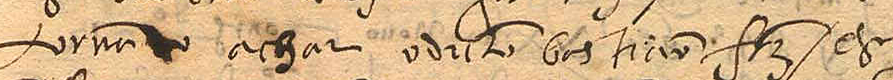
torn̄ado achar o dic̄to bastiaõ fr̄z / lhe
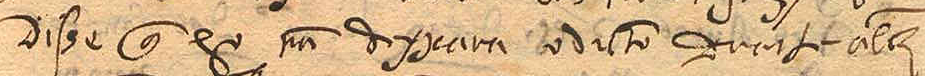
Disse q̄ ho nā deyxaua o dic̄to Duarte ālz
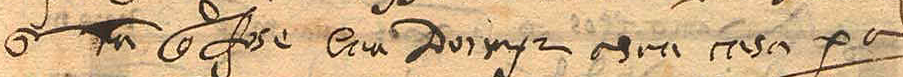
se nā q̄ fose laa Dormyr a sua casa ꝑa
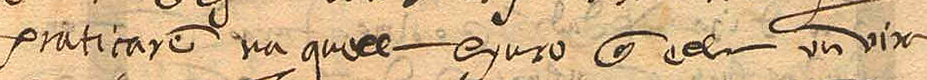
praticarē naquelle lyuro q̄ elle ouvira
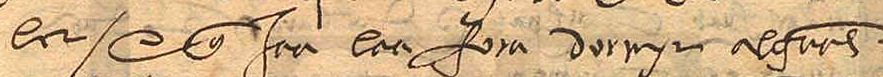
ler / e q̄ Jaa laa fora dormyr alḡuas
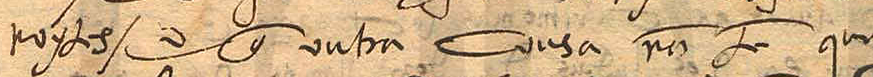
noytes / e q̄ outra Cousa nā tē que
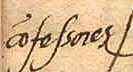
cōfessores /
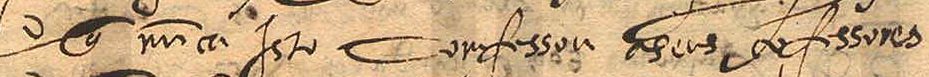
e q̄ nūca Jsto Comfessou a seus cōfessores
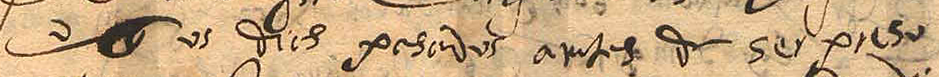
e q̄ os dias pasados amtes de ser preso
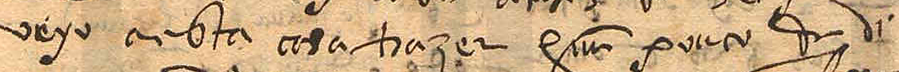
veyo a esta casa trazer hūu pouco de di
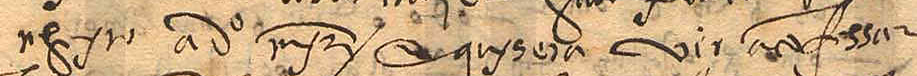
nheyro a do m̄jz / e quysera vir a cōfessar
